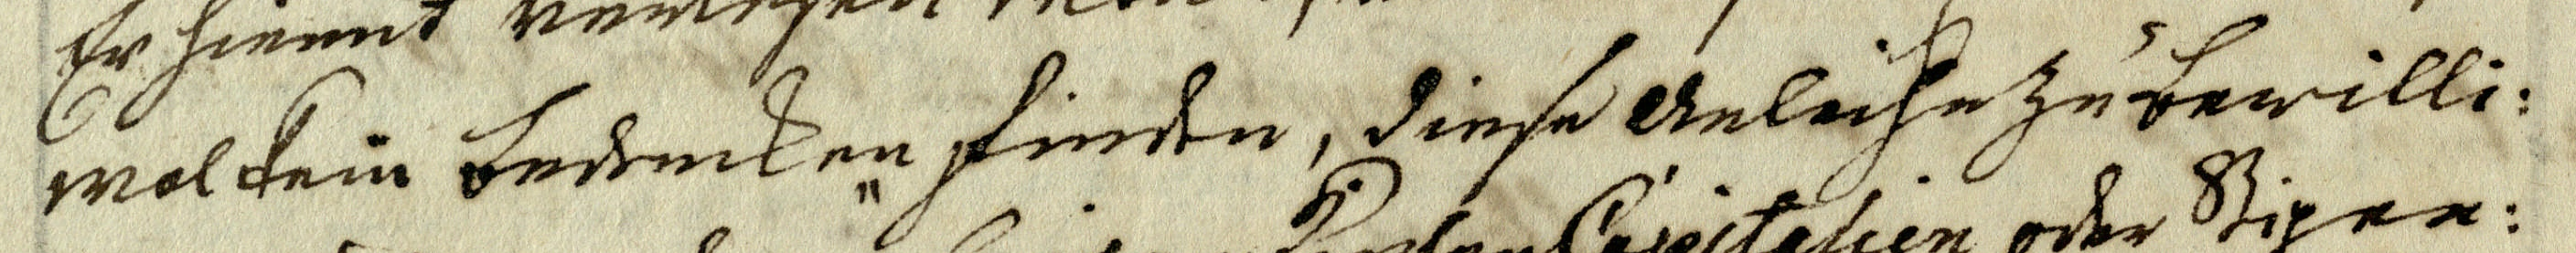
wol kein Bedencken finden, diese Anleihe zu bewilli¬
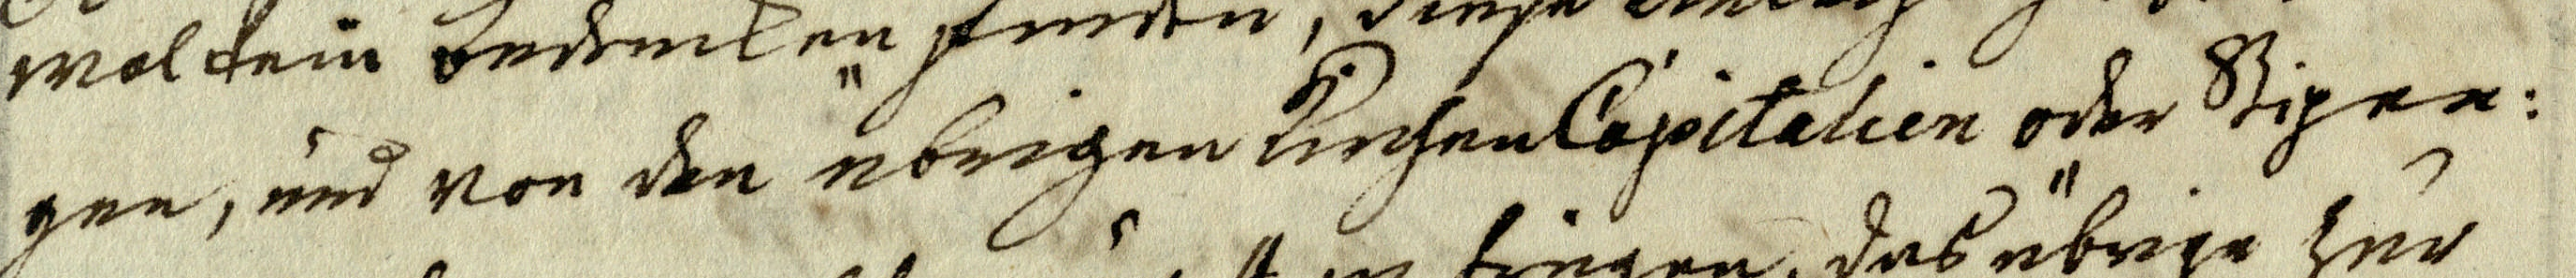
gen, und von den übrigen Kirchen Capitalien oder Stipen¬
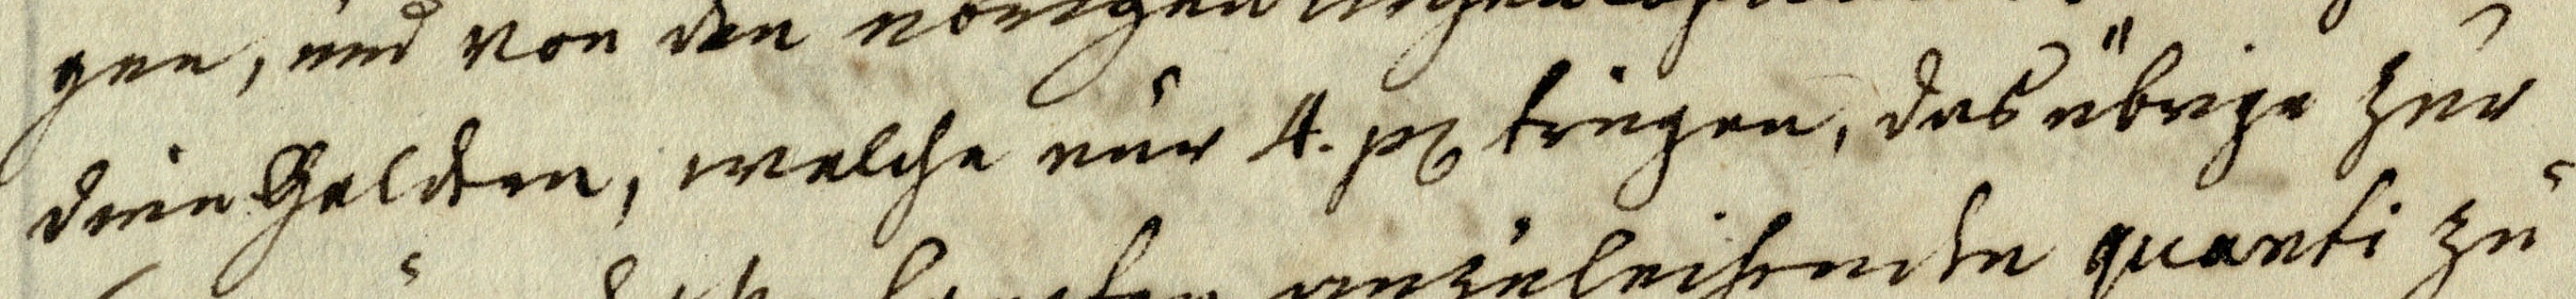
dien Geldern, welche nur 4. p. trügen, das übrige zur
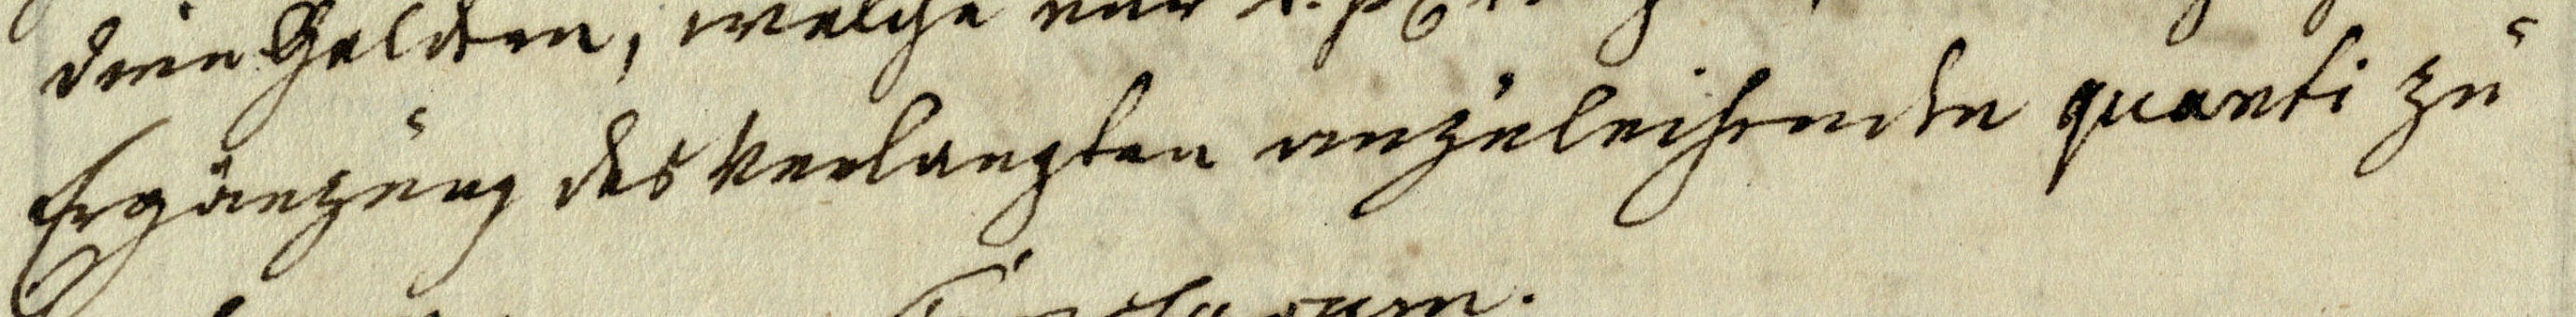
Ergänzung des verlangten anzuleihenden quanti zu
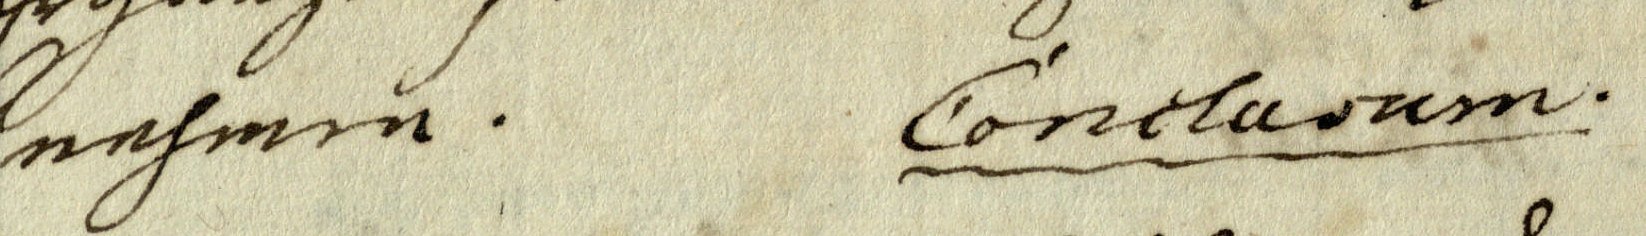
nehmen. Conclusum
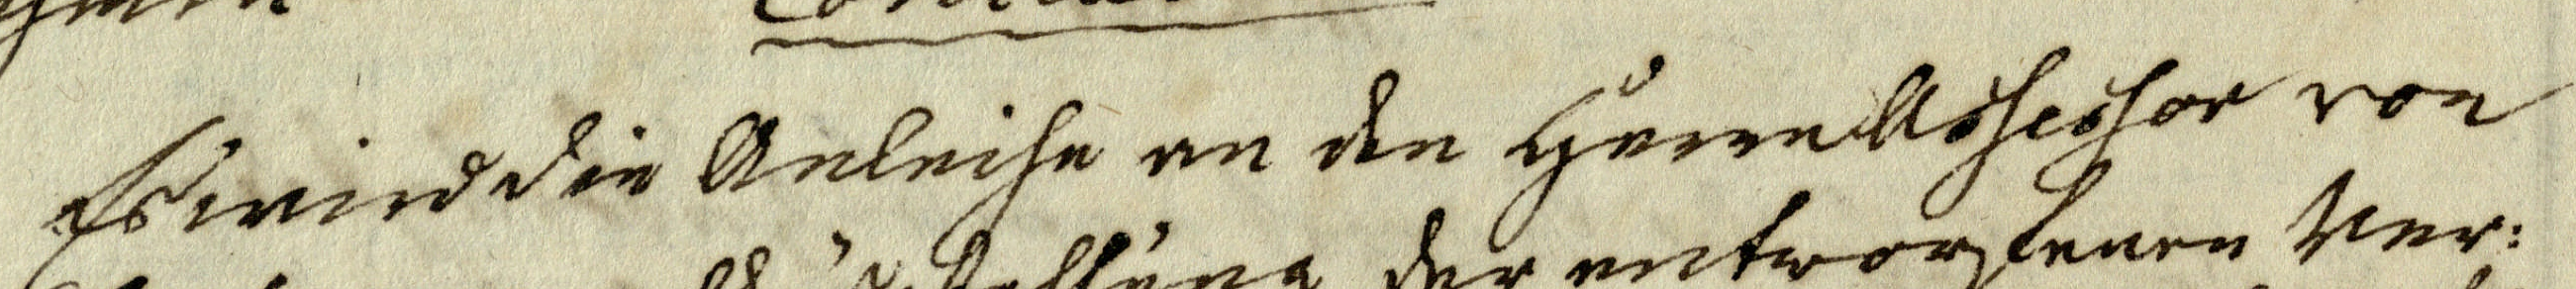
Es wird die Anleihe an den Herrn Assessor von
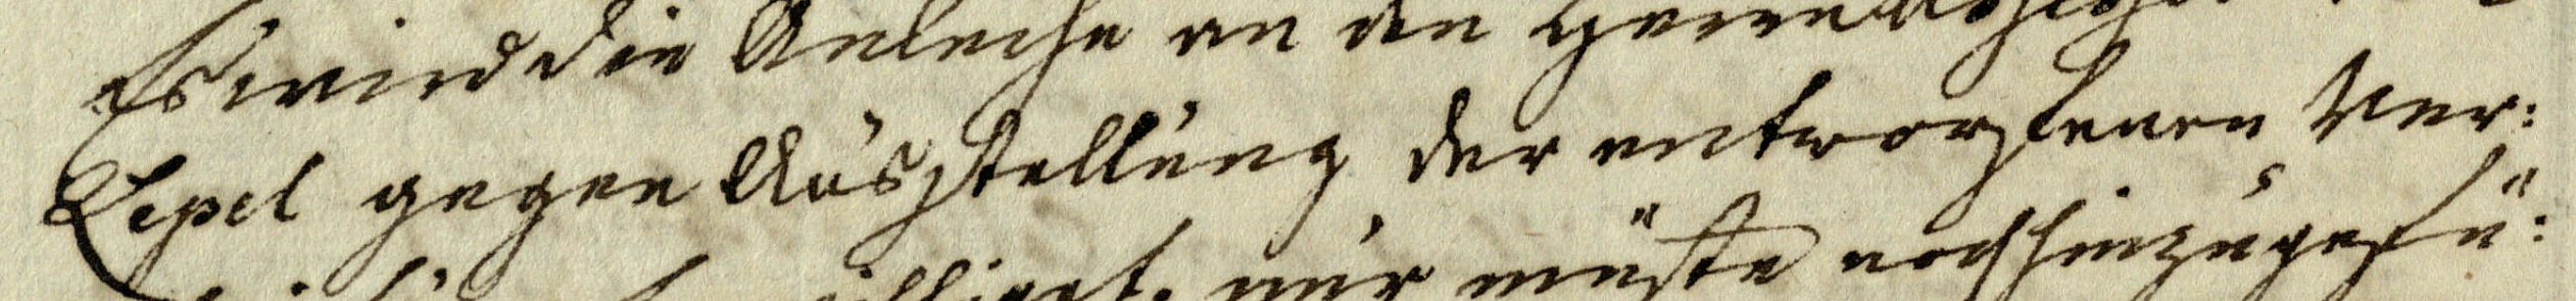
Lepel gegen Ausstellung der entworfenen Ver¬
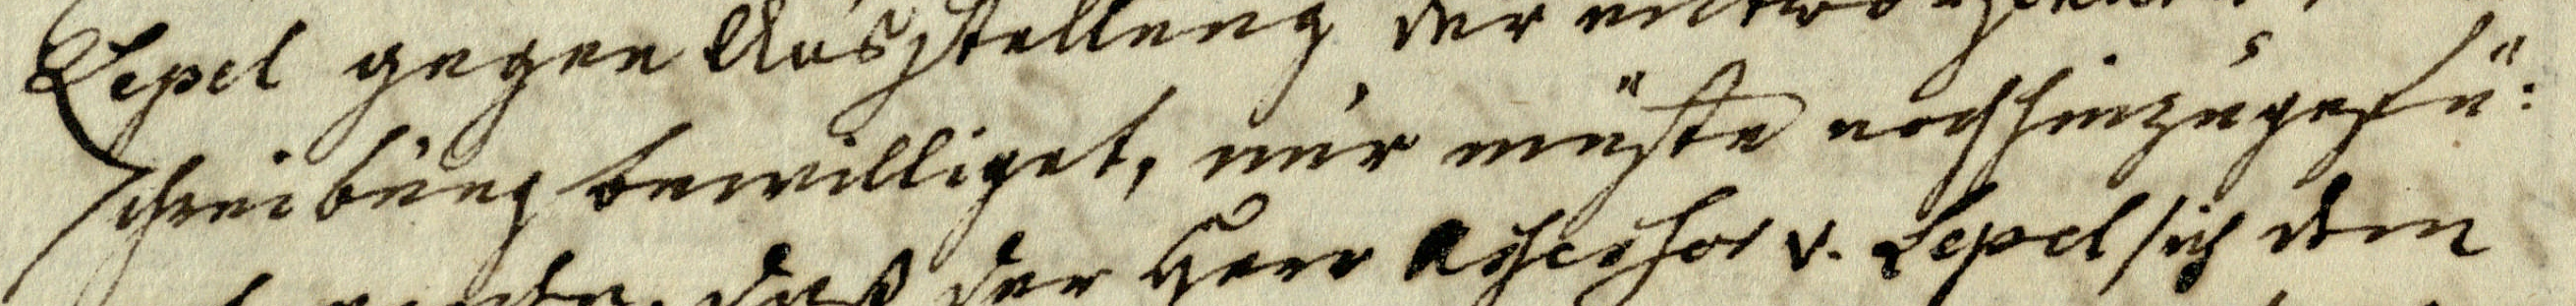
schreibung bewilliget, nur müste noch hinzugefü¬
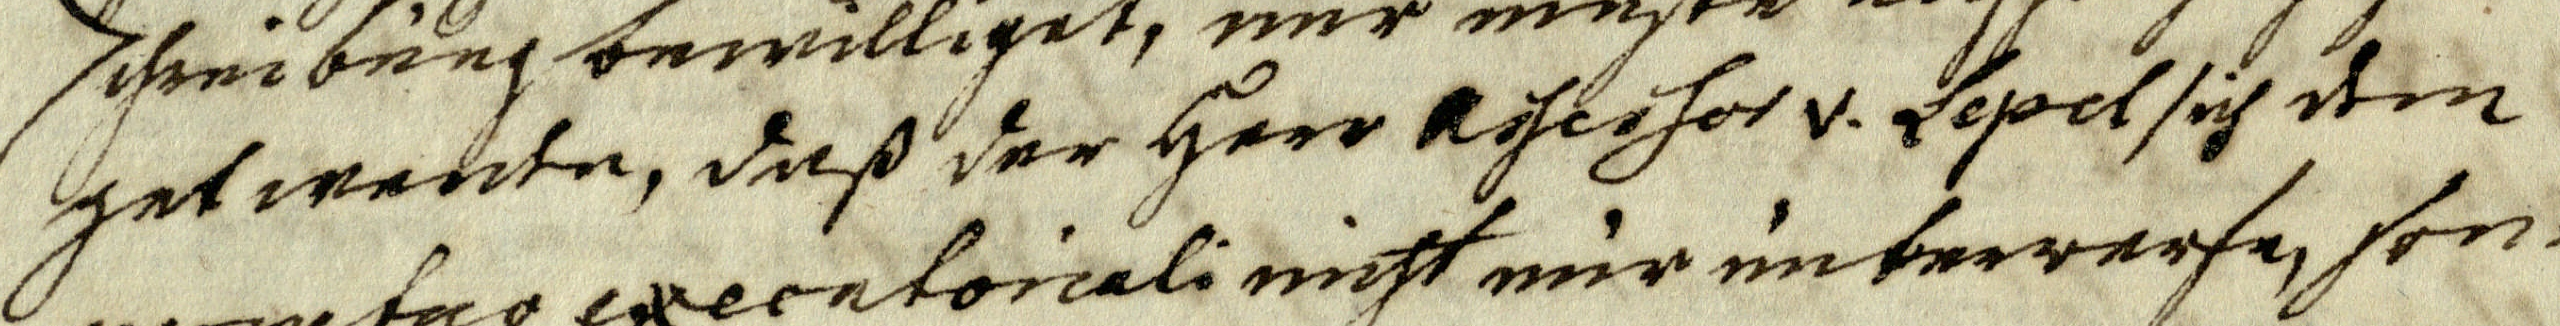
get werden, daß der Herr Assessor v. Lepel sich dem
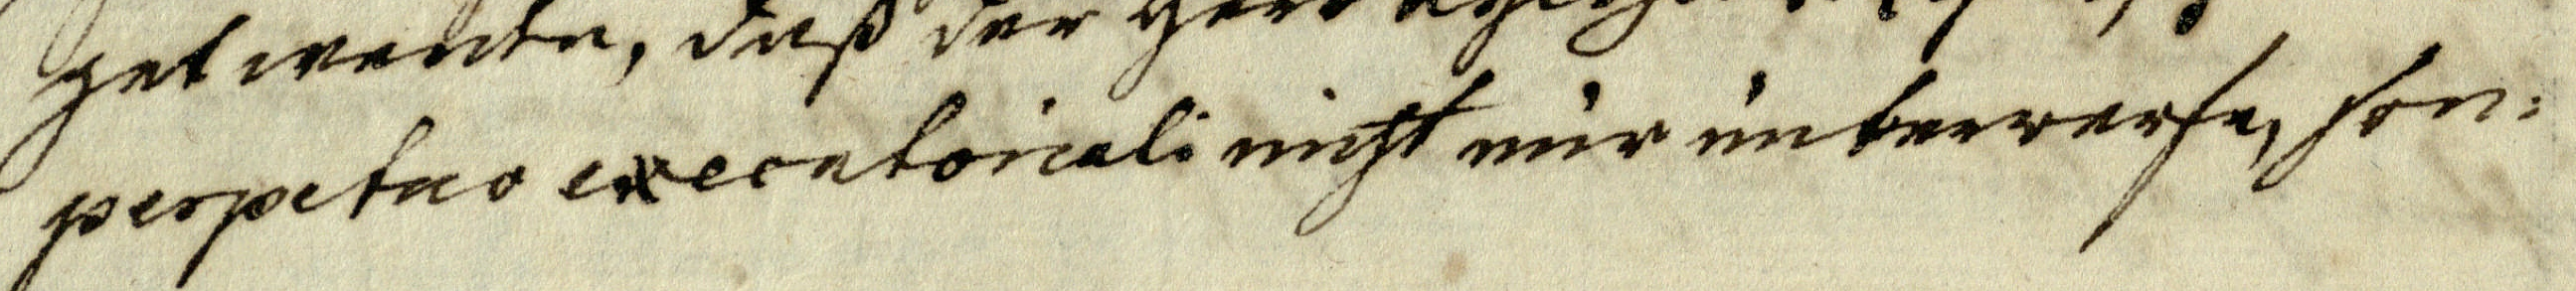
perpetuo executoriali nicht nur unterwerfe, son¬
